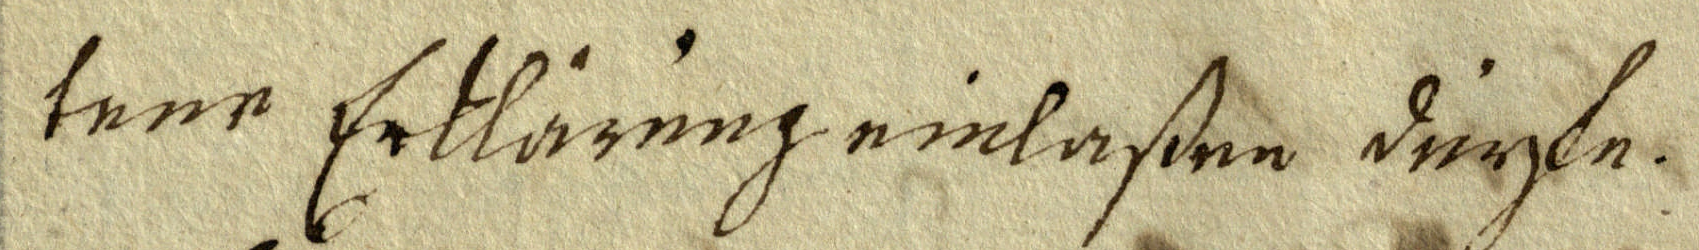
tene Erklärung einlaßen dürfe.
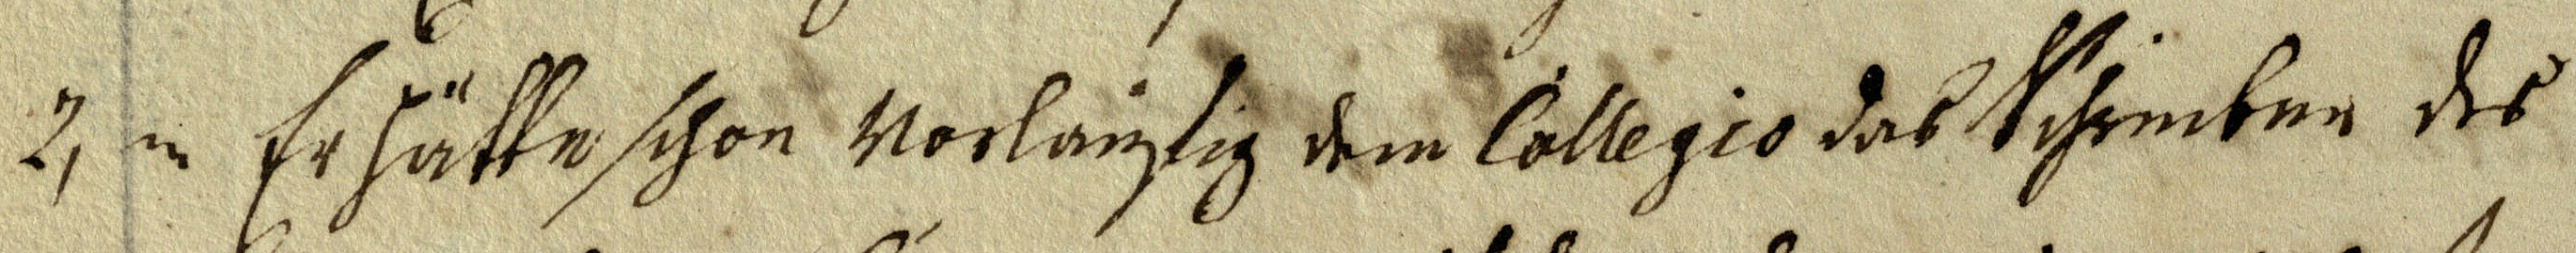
2, Er hätte schon vorläufig dem Collegio das Schreiben des
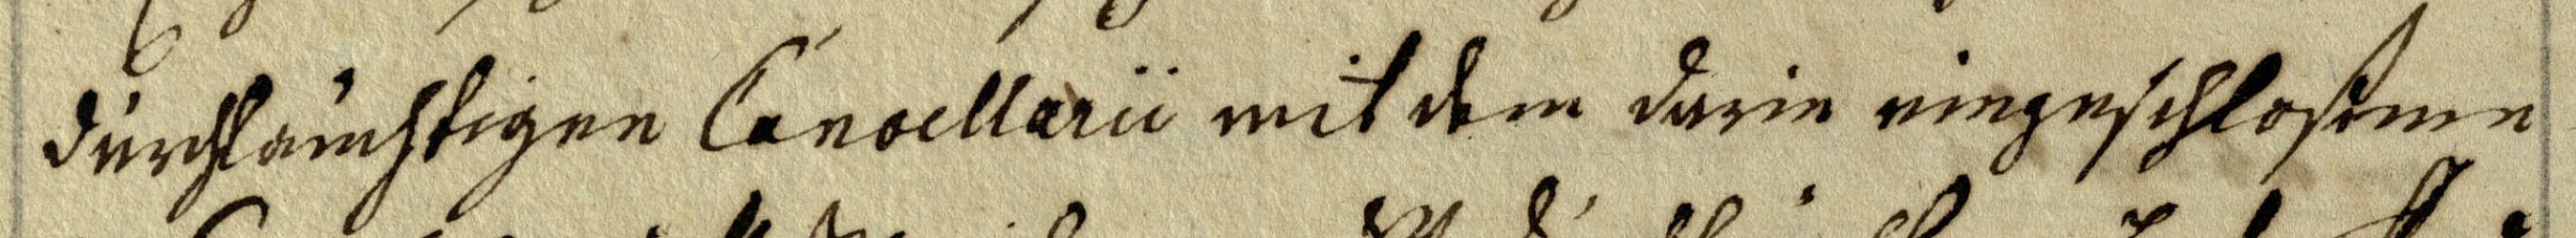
durchläuchtigen Cancellarii mit dem darin eingeschloßenen
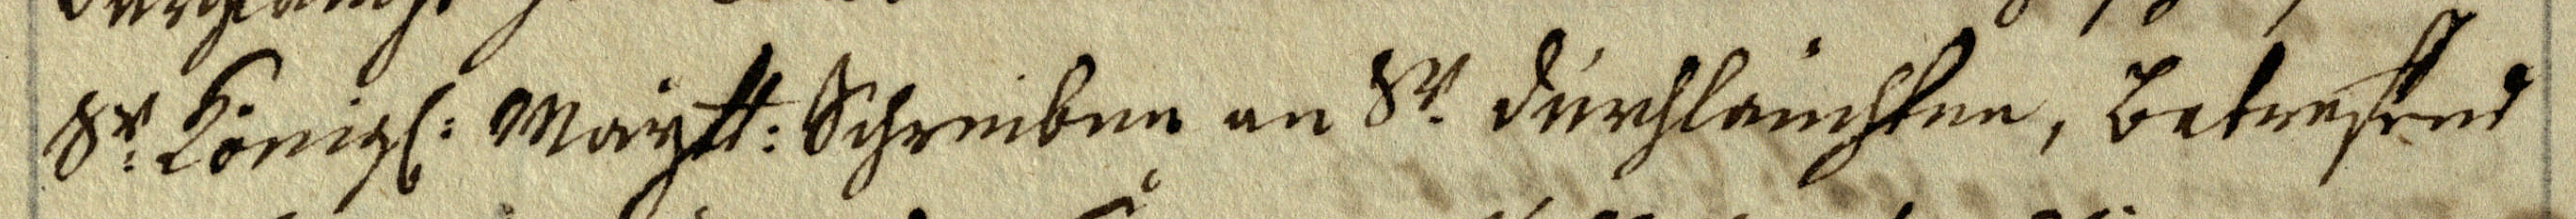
Sr Königl. Maÿtt. Schreiben an Sr Durchlauchten, betreffend
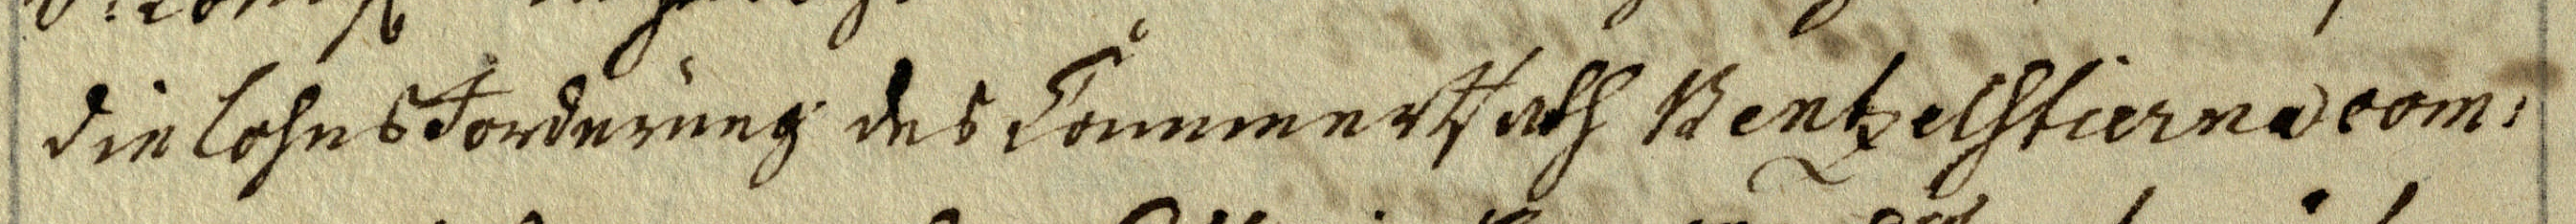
die LohnsForderung des CammerRath Bentzelstierna com¬
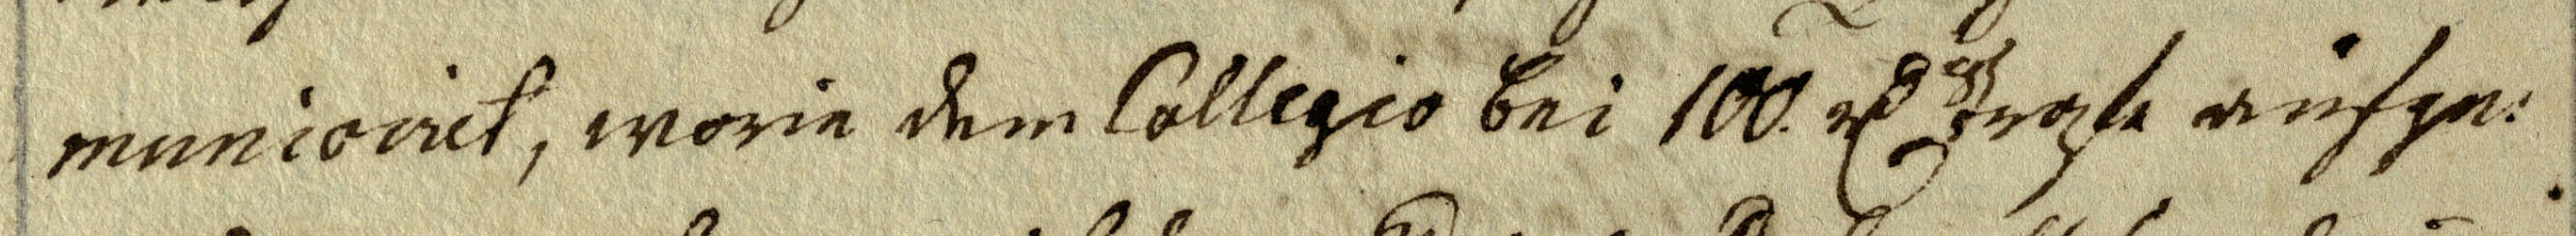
municiret, worin dem Collegio bei 100 r Strafe aufge¬
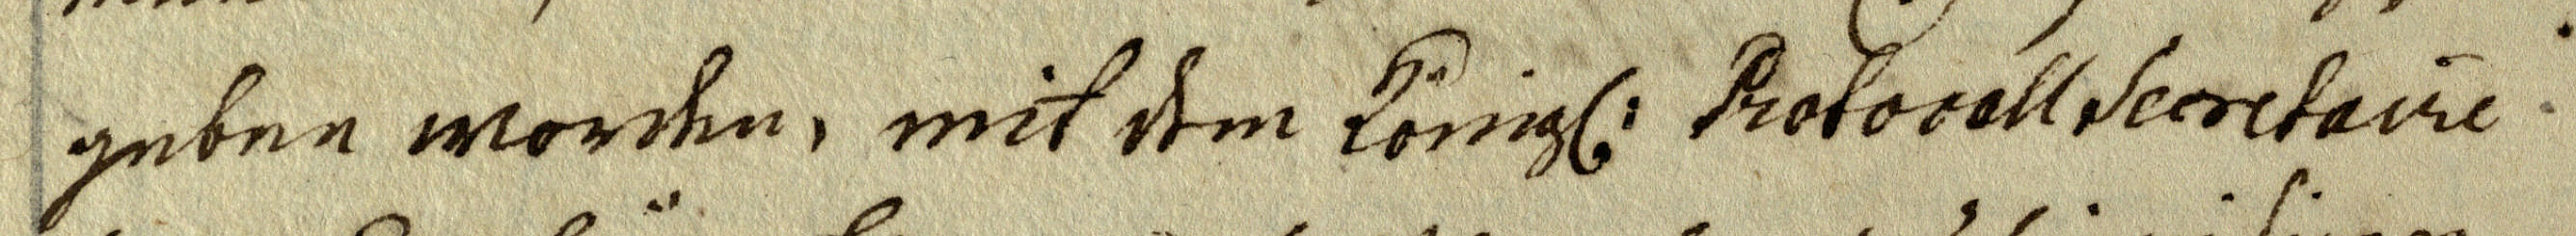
geben worden, mit dem Königl. Protocoll Secretaire
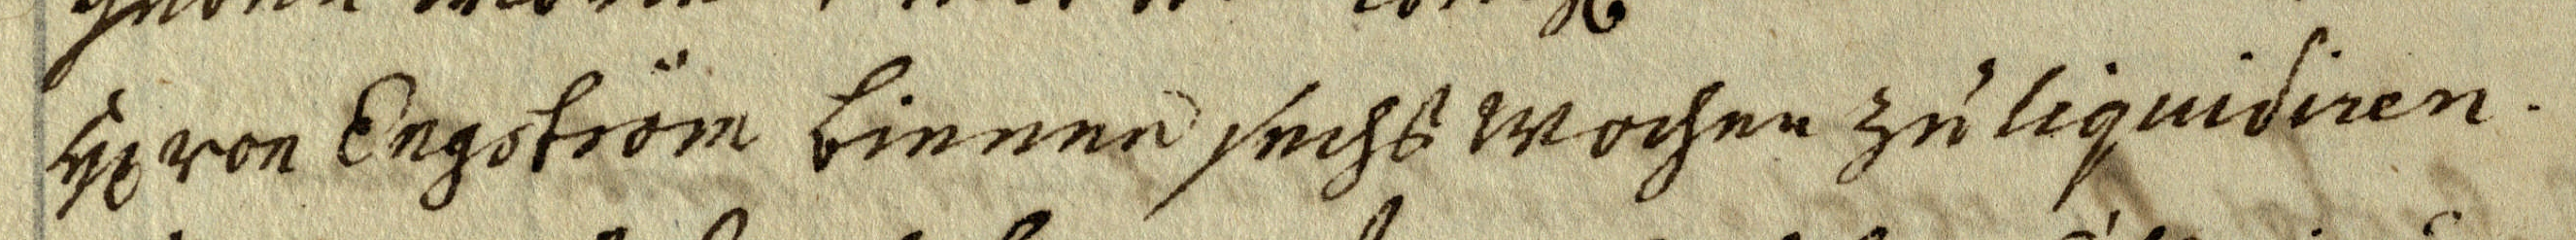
hr. von Engström binnen sechs Wochen zu liquidiren.
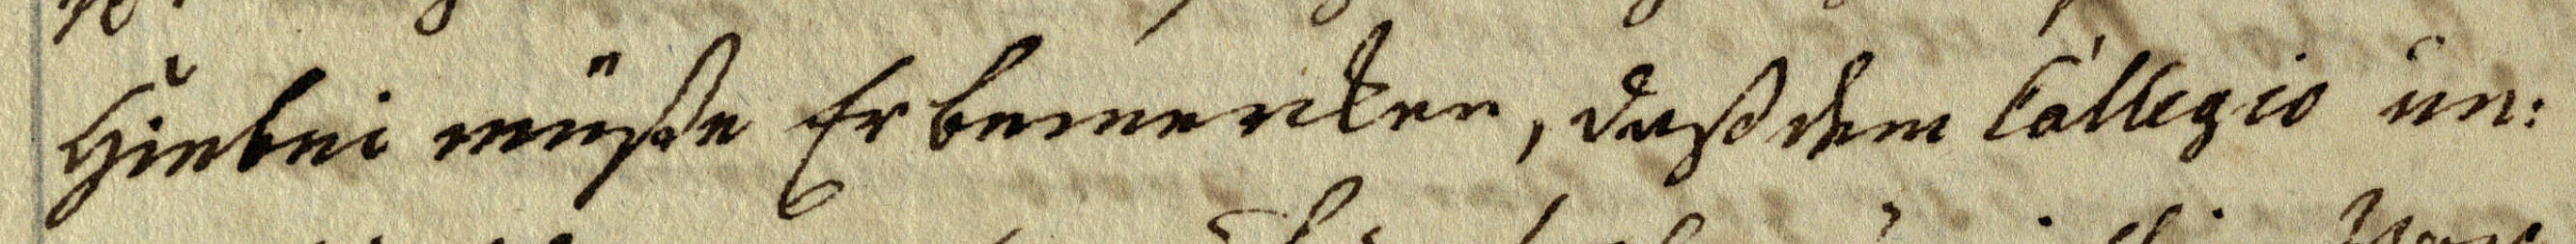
Hiebei müße Er bemerken, daß dem Collegio un¬
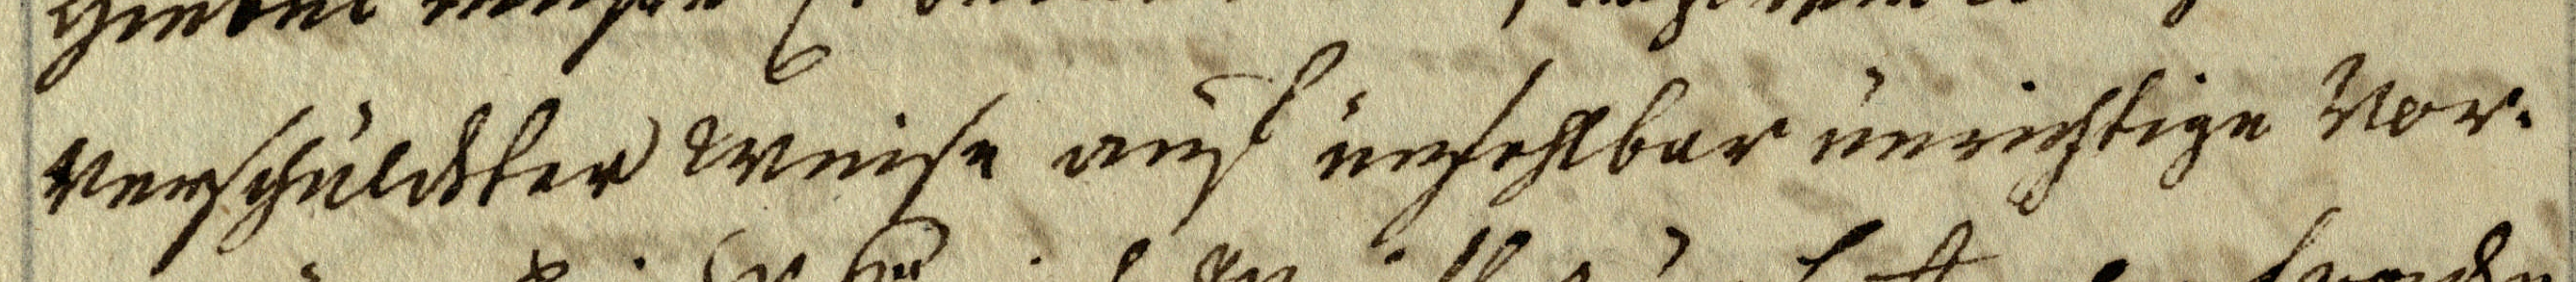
verschuldeter Weise auf unfehlbar unrichtige Vor¬
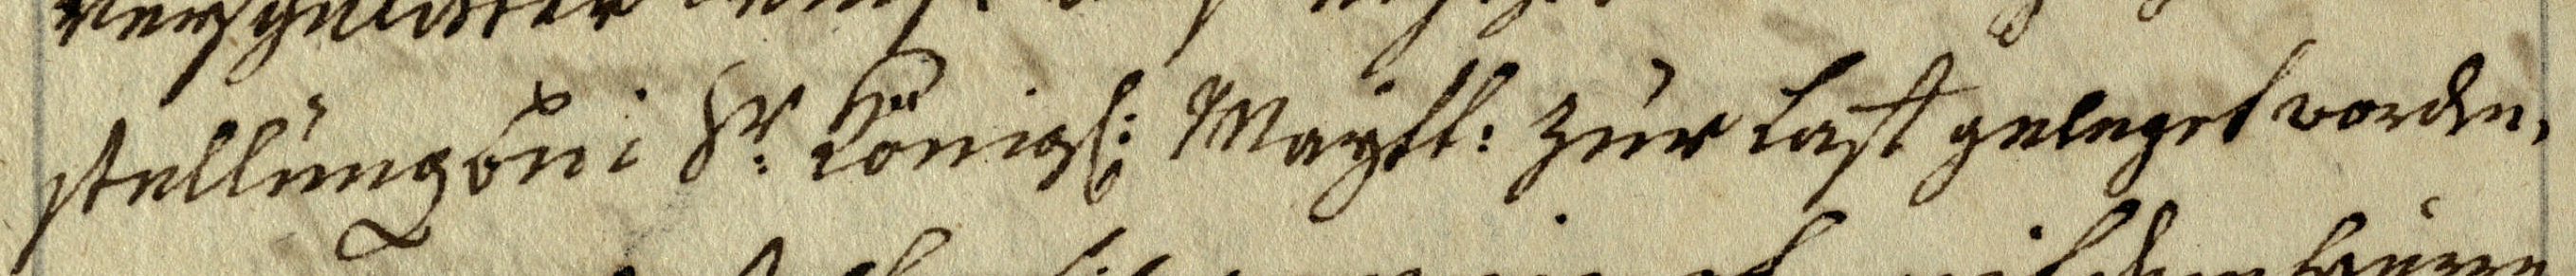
stellung bei Sr Königl. Maÿtt. zur Last geleget worden,
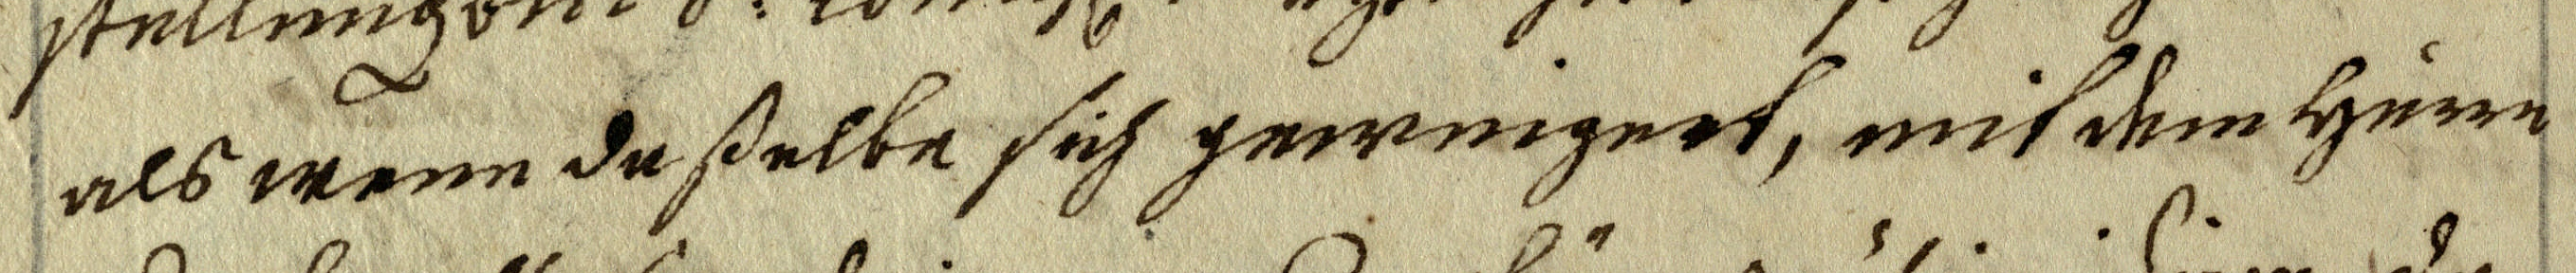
als wenn daßelbe sich geweigert, mit dem Herrn
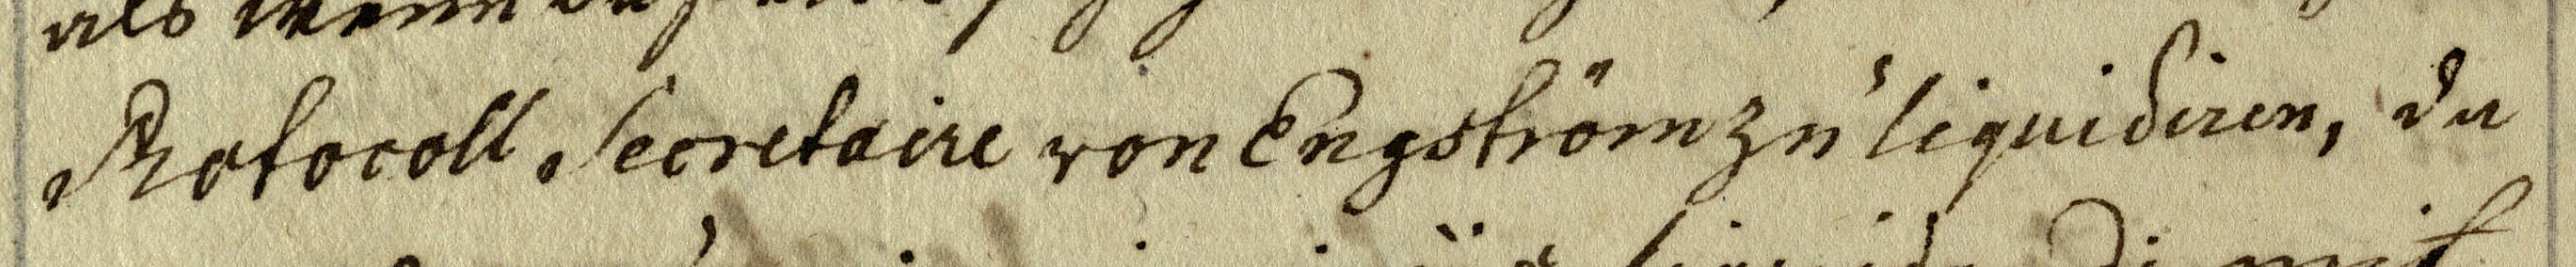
Protocoll Scretaire von Engström zu liquidiren, da
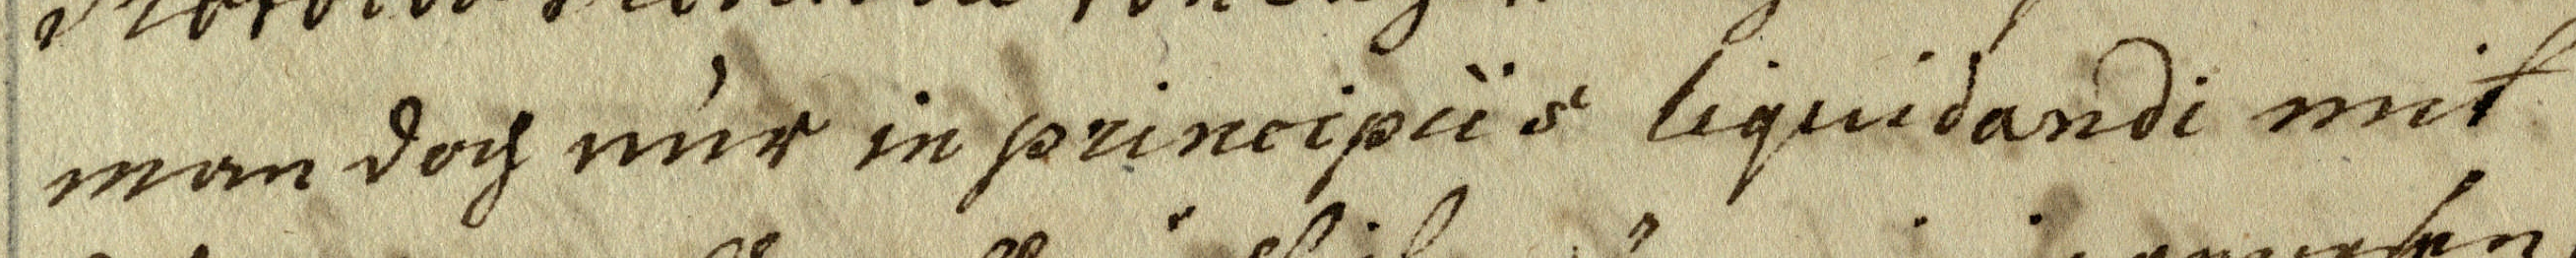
man doch nur in principiis liquidandi mit
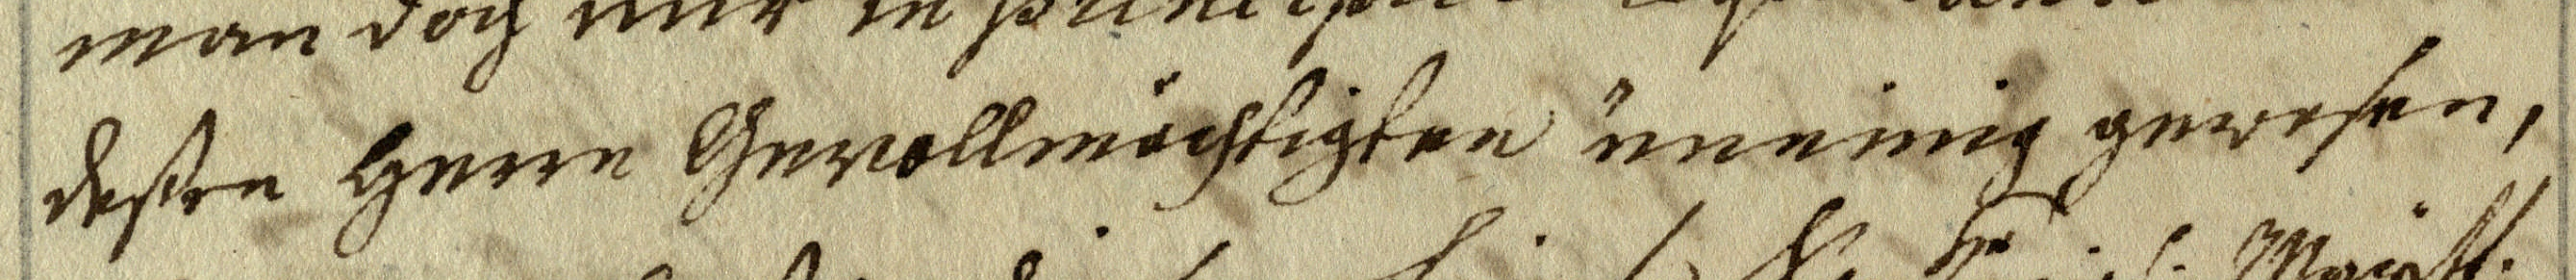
deßen Herrrn Gevollmächtigten uneinig gewesen,
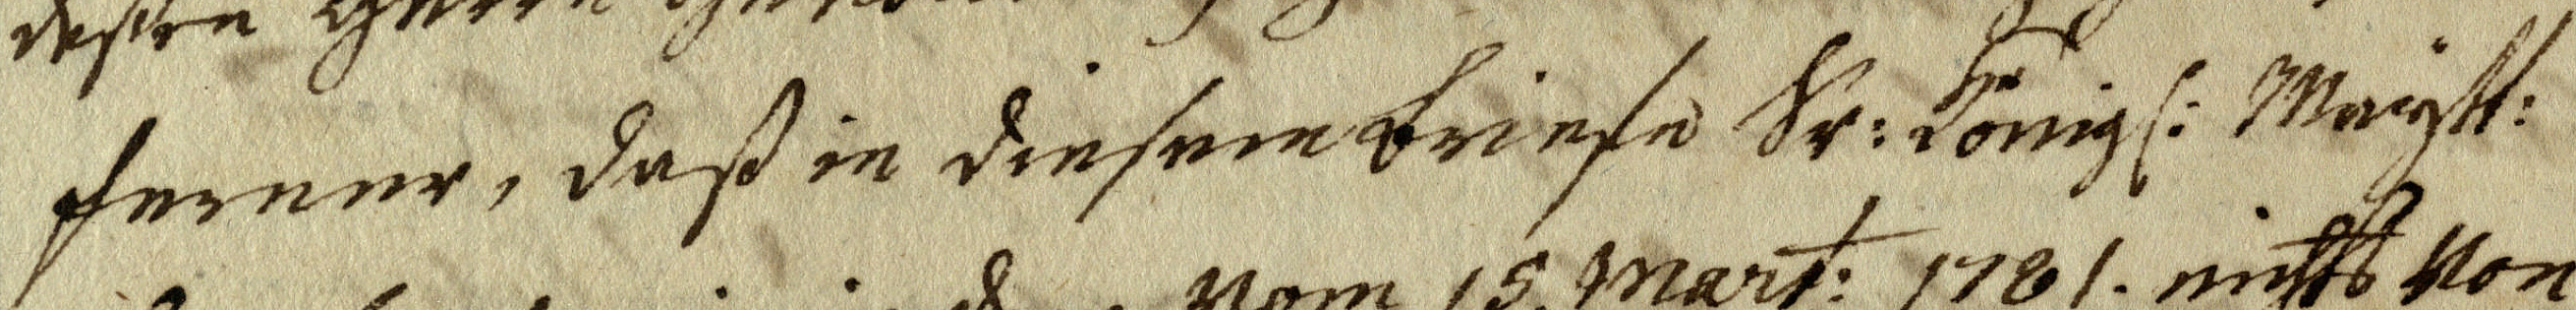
ferner, daß in diesem Briefe Sr. Königl. Maÿtt.
